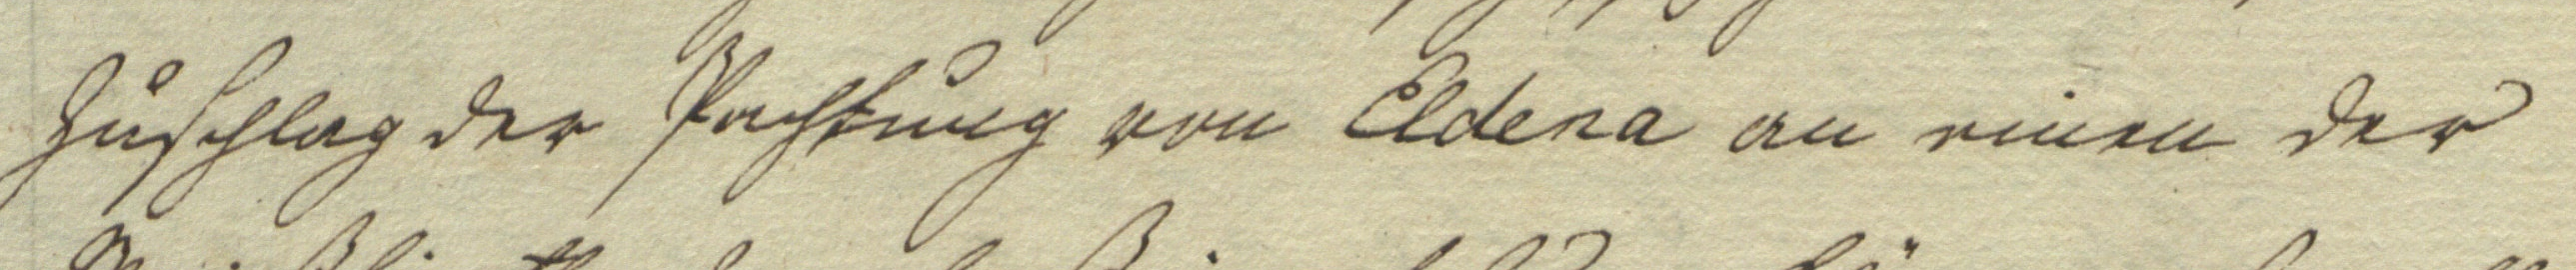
Zuschlag der Pachtung von Eldena an eine der
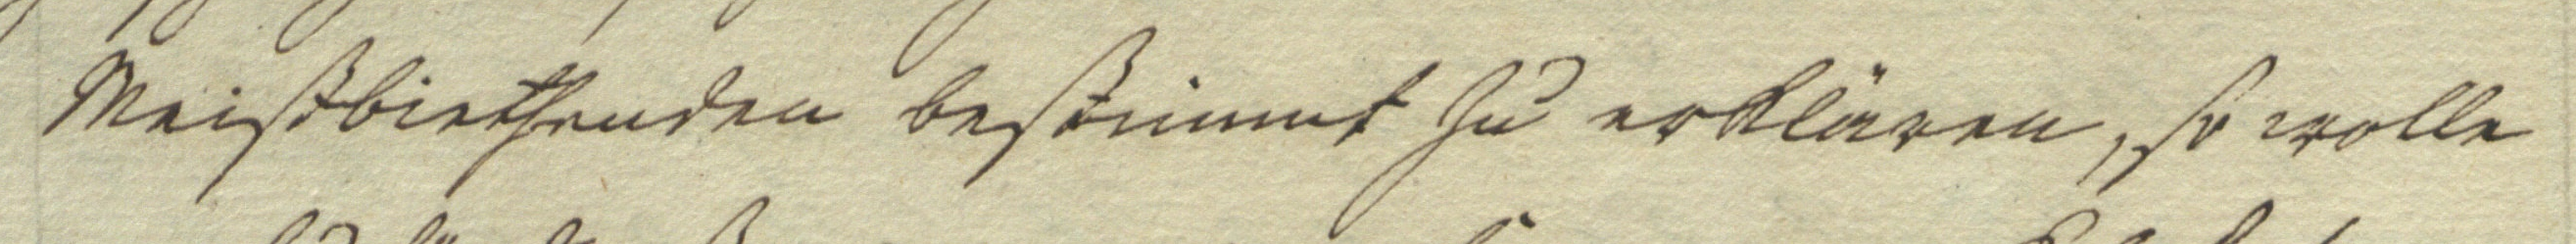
Meistbiethenden bestimmt zu erklären, so wolle
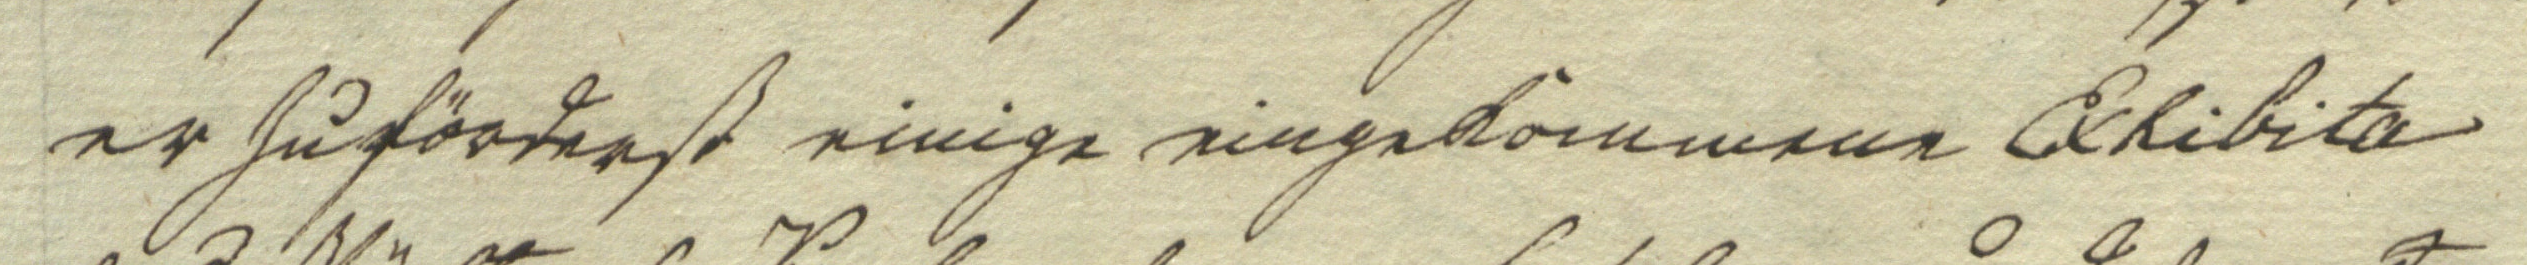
er zuförderst einige eingekommene Exhibita
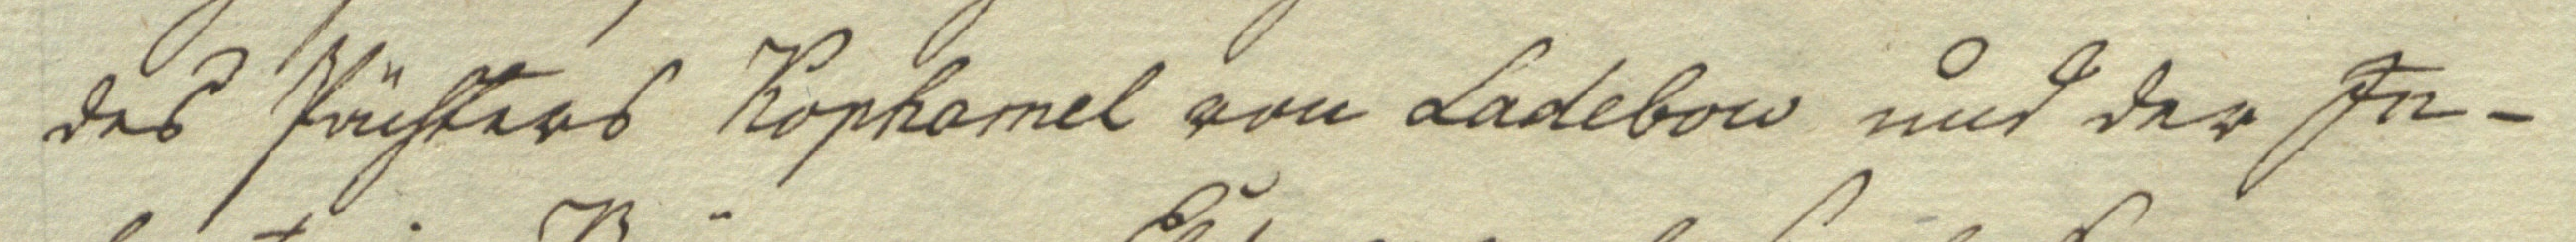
des Pächters Kophamel von Ladebow und der In¬
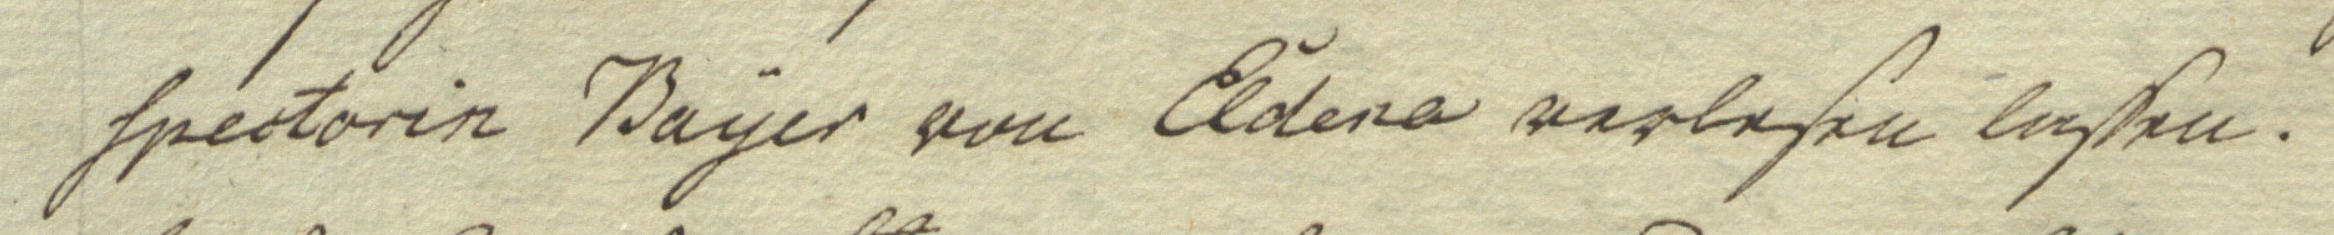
spectorin Baÿer von Eldena verlesen lassen.
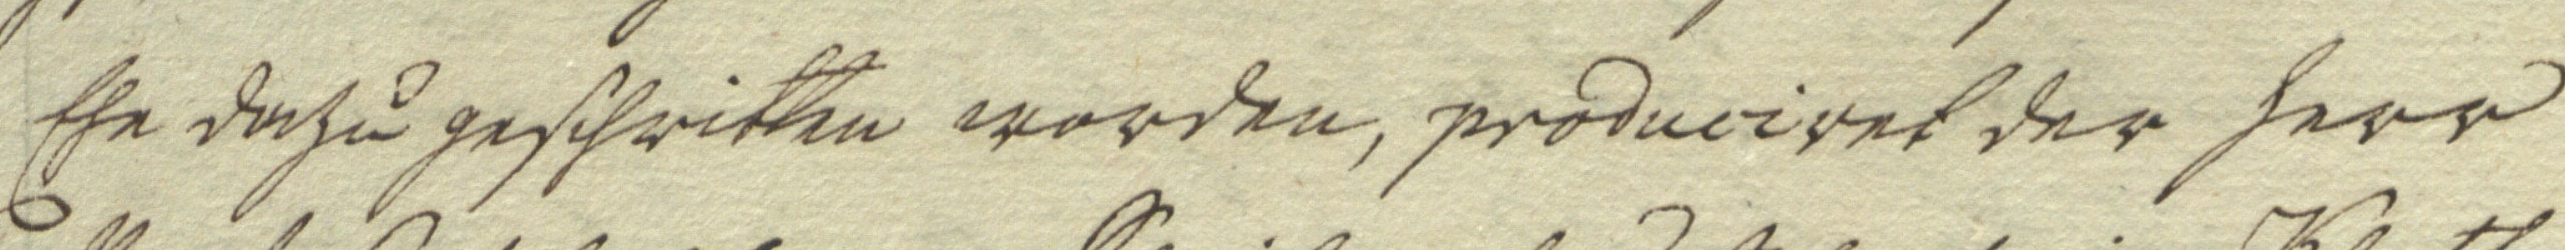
Ehe dazu geschritten worden, produciret der Herr
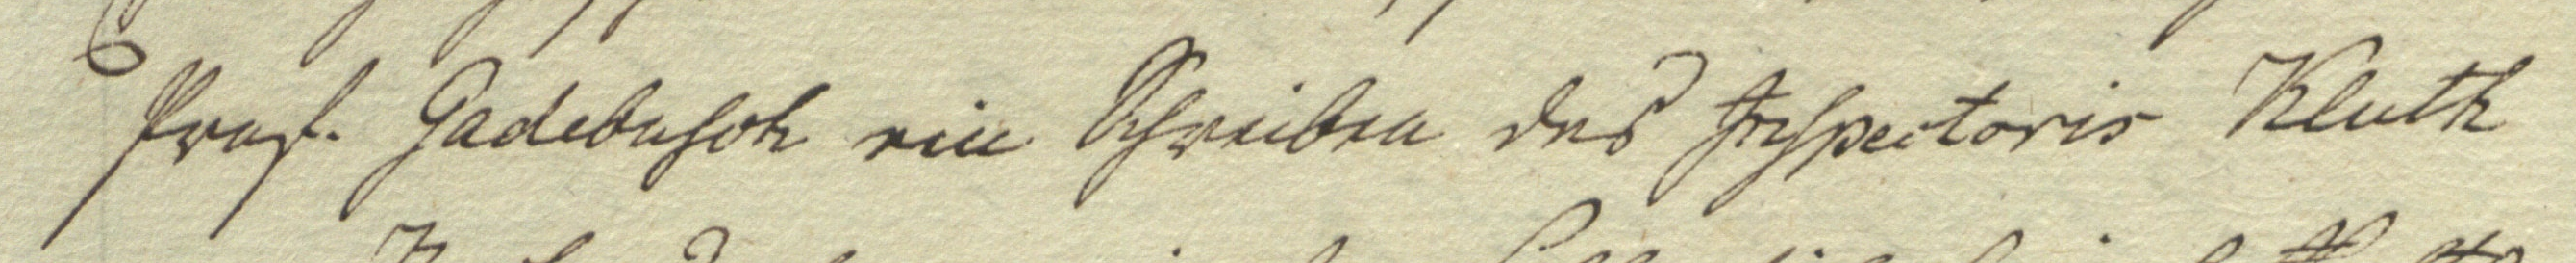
Prof. Gadebusch ein Schreiben des Inspectoris Kluth
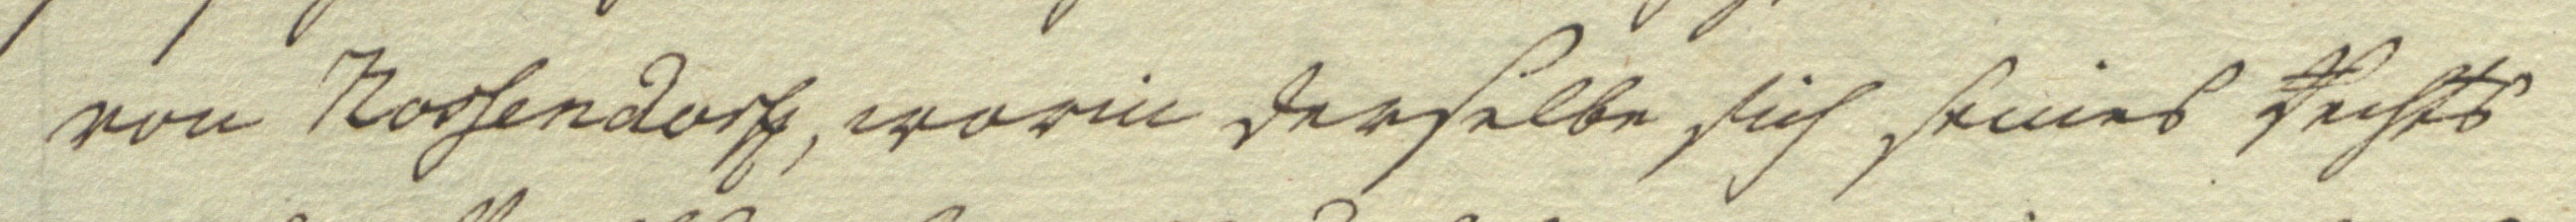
von Nossendorff, worin derselbe sich seines Rechts
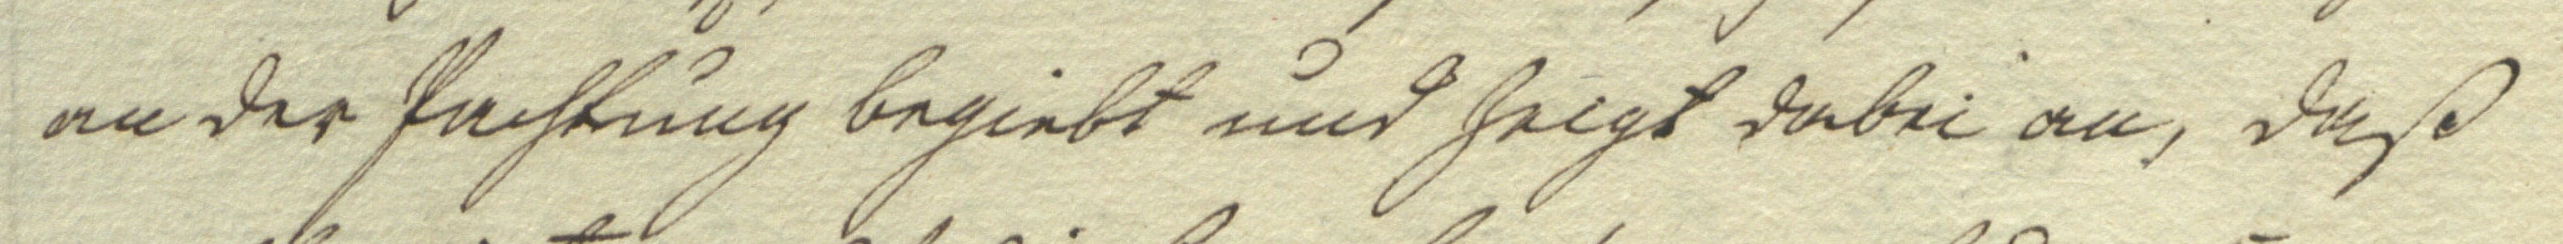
an der Pachtung begiebt und zeigt dabei an, daß
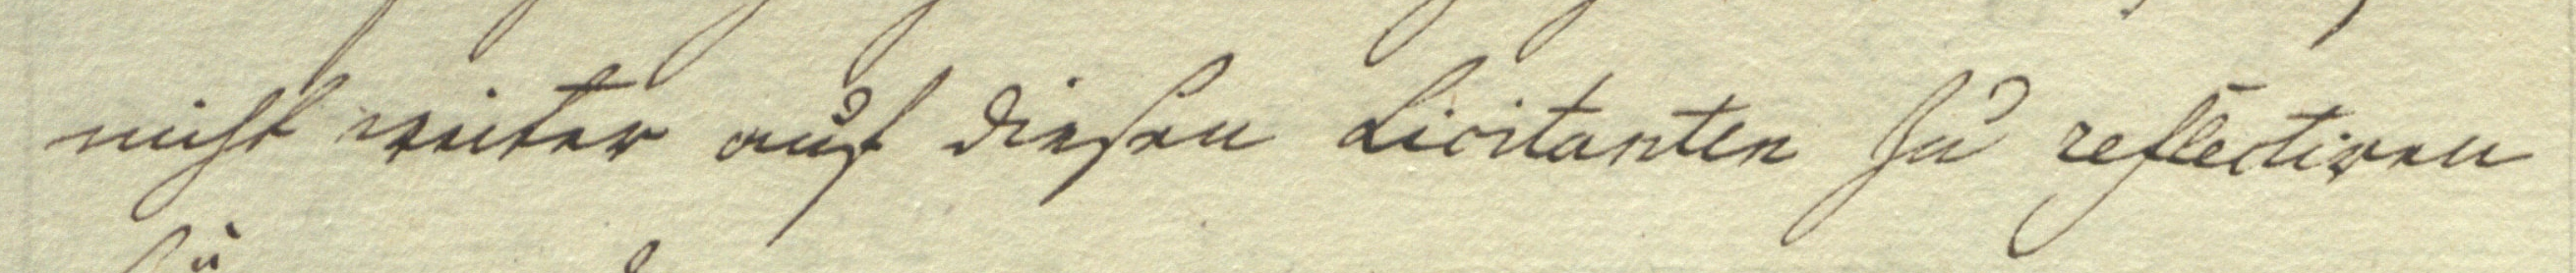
nicht weiter auf diesen Licitanten zu reflectiren
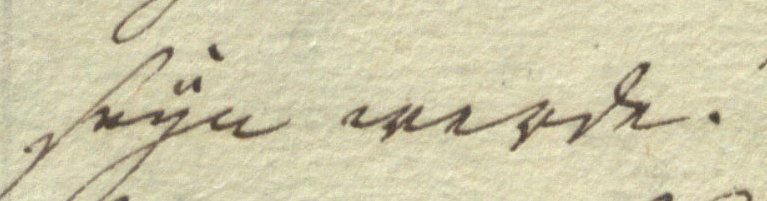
seÿn werde.
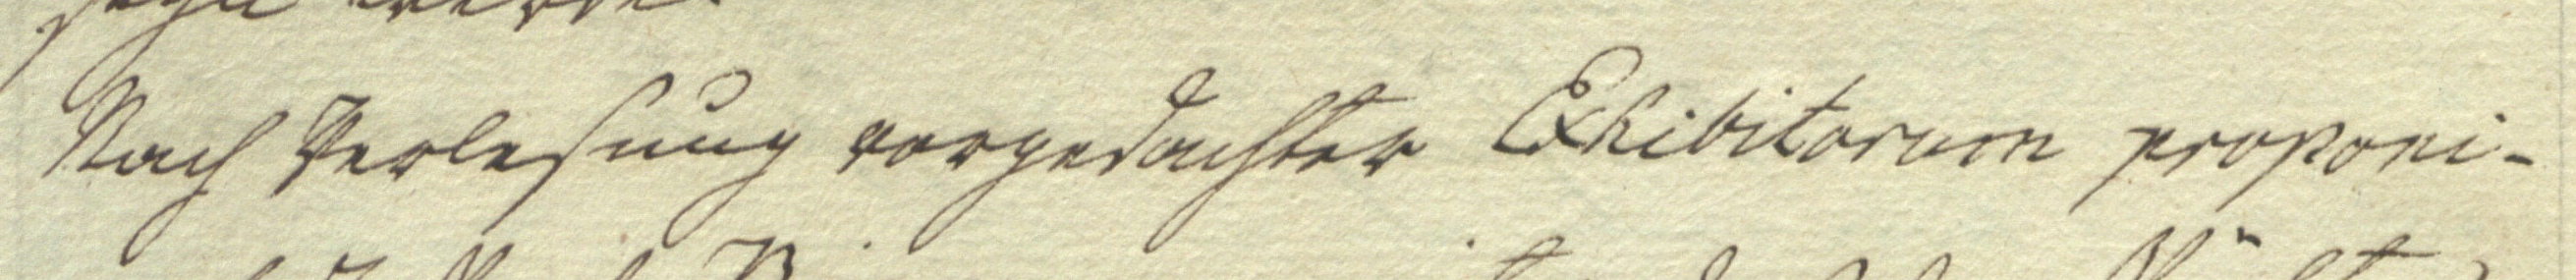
Nach Verlesung vorgedachter Exhibitorum proponi¬
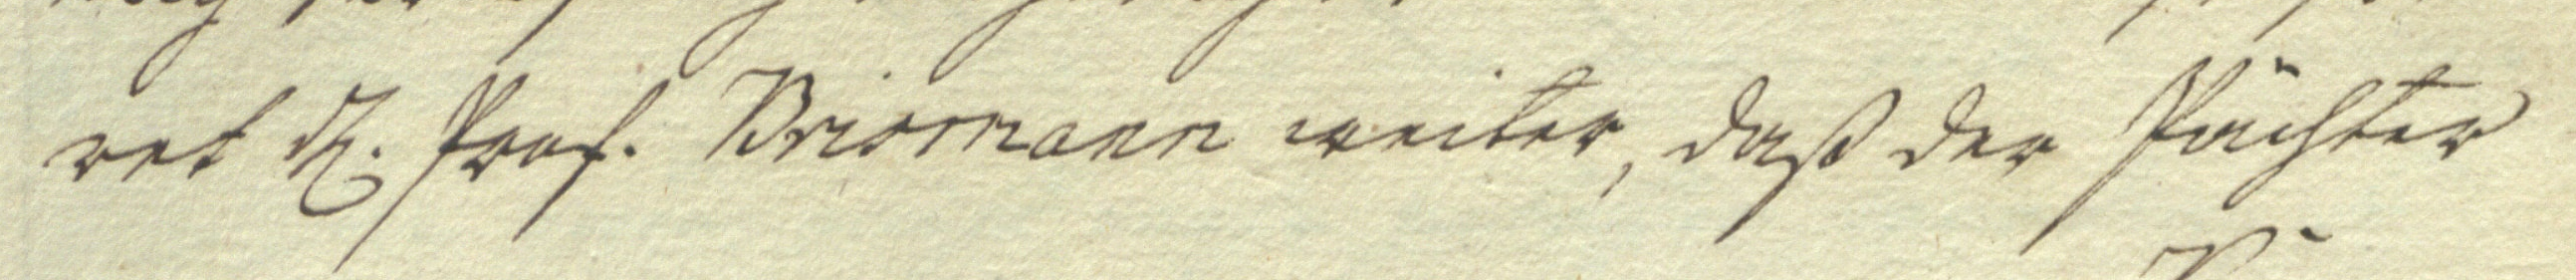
ret dh. Prof. Brismann weiter, daß der Pächter
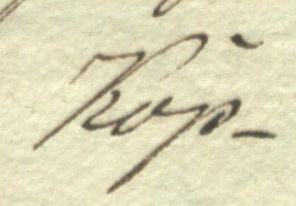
Kop
